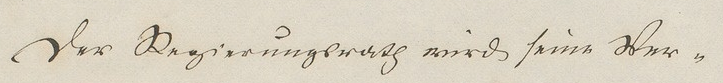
Der Regierungsrath wird seine Ver-
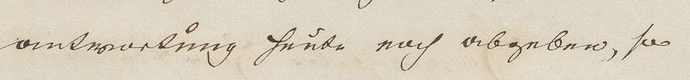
antwortung heute noch abgeben, so
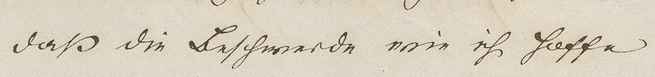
daß die Beschwerde wie ich hoffe
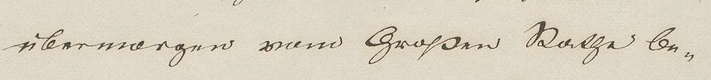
übermorgen vom Großen Rathe be-
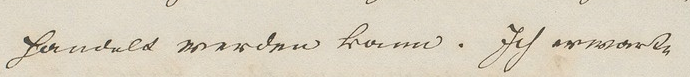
handelt werden kann. Ich erwarte
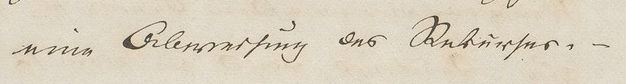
eine Ablehnung des Rekurses. –
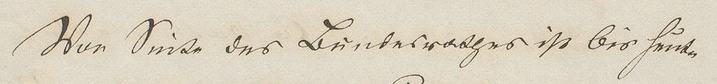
Von Seite des Bundesrathes ist bis heute
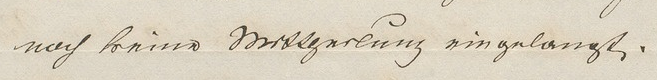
noch keine Mittheilung eingelangt.
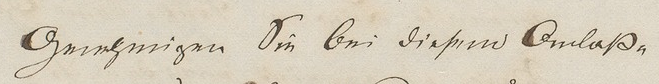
Genehmigen Sie bei diesem Anlaße
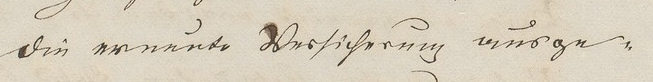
die erneute Versicherung ausge-
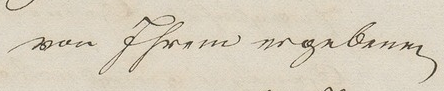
von Ihrem ergebenen
